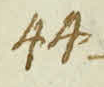44
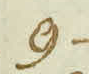9
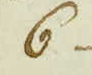6
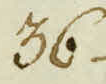36
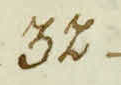32
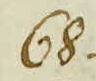68
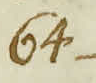64
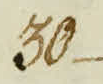30
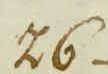26
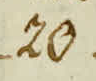20
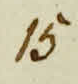15
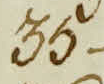35
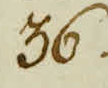36
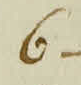6
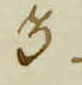3
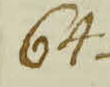64
